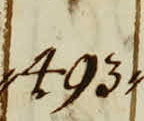493
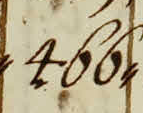466
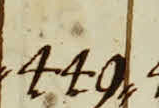449
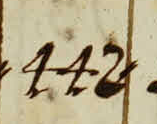442
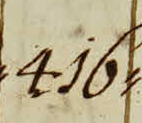416
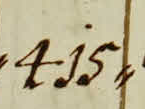415
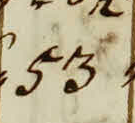53
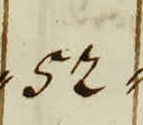52
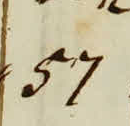57
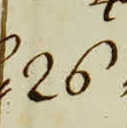26
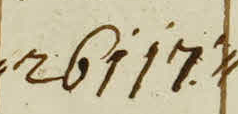26117.
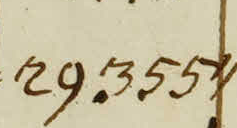29355
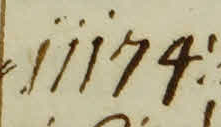11174
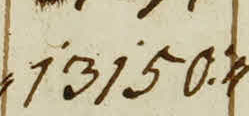13150.
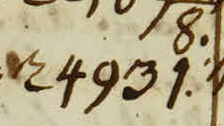24931.
